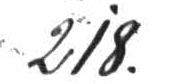218.
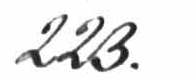223.
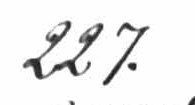227.
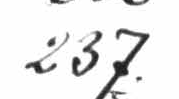237.
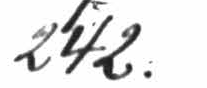242.
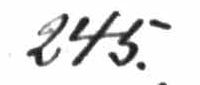245.
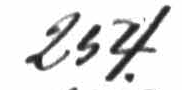254.
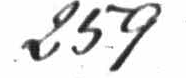259
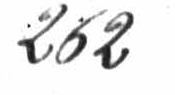262
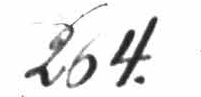264.
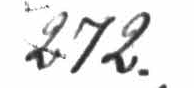272.
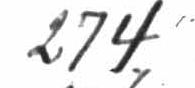274
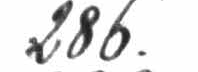286.
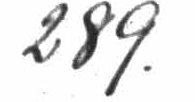289.
